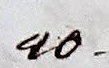40
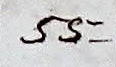55
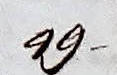49
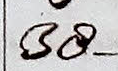38
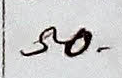50
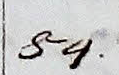54
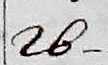26
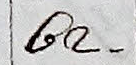62
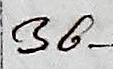36
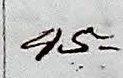45
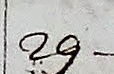29
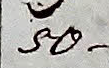50
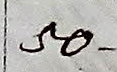50
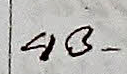43
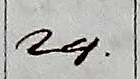24.
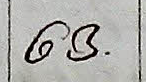63.
